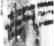三
